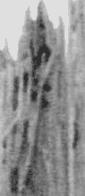喿
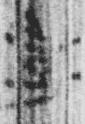斿（遊）
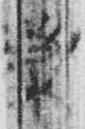樂
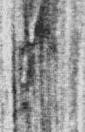也
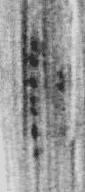斿（遊）
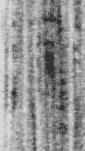聖（聲）
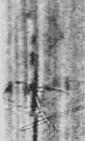也
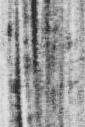斿（遊）
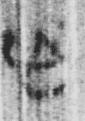心
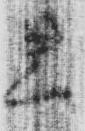也
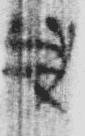凡
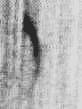人
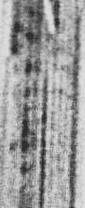情
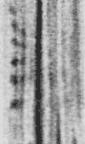爲
